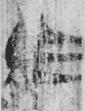於
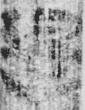是
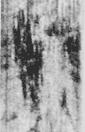{虍介}（乎）
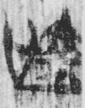唫（喑）
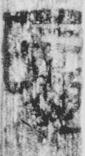聾
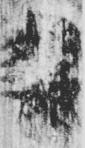執
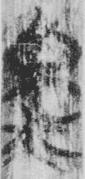燭
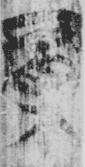○（矇）
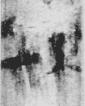○（瞽）
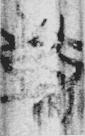○（鼓）
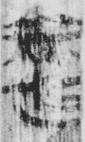○（瑟）
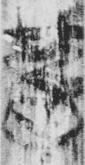○（跛）
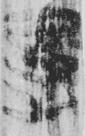○（躃）
